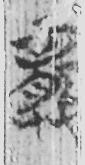龏
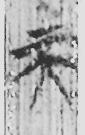天
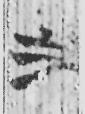之
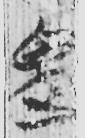畏
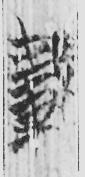載
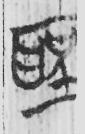聖
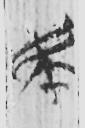民
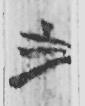之
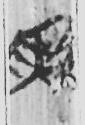䌛
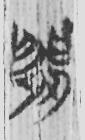{門夕刀}
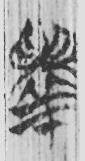鬲
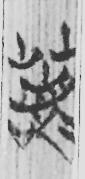{艹若}
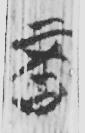否
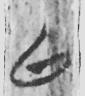㠯（以）
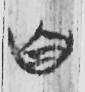自
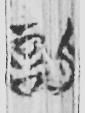訿
